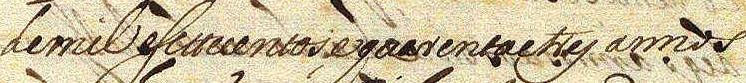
de mil e settecentos, e quarenta e tres annos
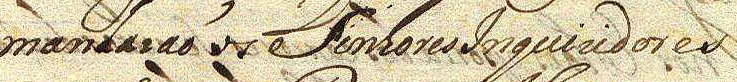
mandaraõ os Senhores Inquizidores
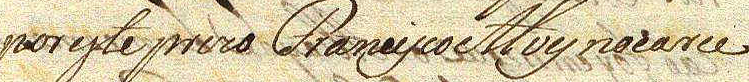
por este prezo Francisco Alues no carce
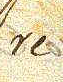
re
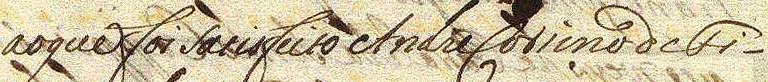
ao que foi satisfeito Andre Corsino de Fi
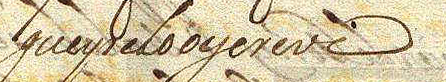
gueyredo o escrevi
